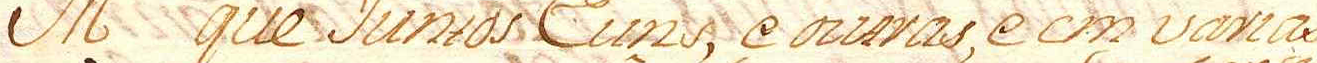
M que Iuntos huns, e outros, e em varias
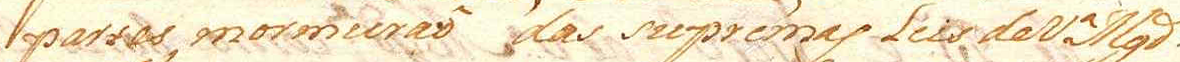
partes mormuraõ das supremas Leis de V.a Magd.e
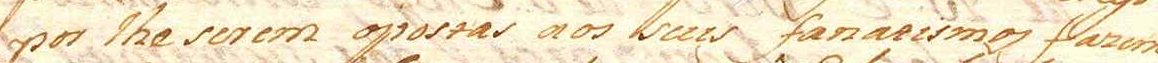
por lhe serem opostas aos seus fanatismos fazem
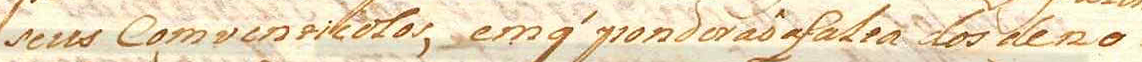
seus ComventicoLos, em q̄ ponderaõ a faLta dos deno
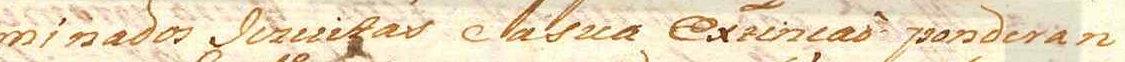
minados Iezuitas e a sua extinçaõ ponderan
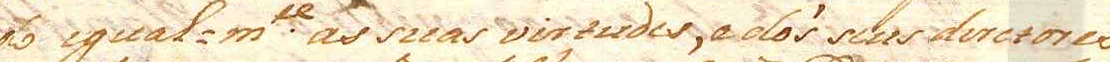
do iguaL=m.te as suas virtudes, e dos seus diretores
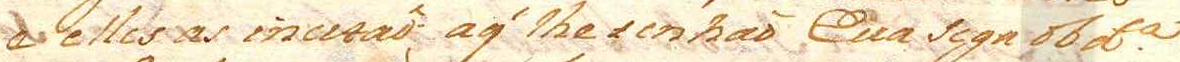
e elles as incitaõ a q̄ lhe tenhaõ hua sega obd̄.a
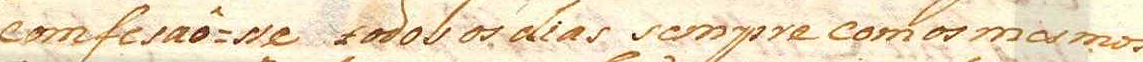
comfesaõ=sse todos os dias sempre com os mesmos
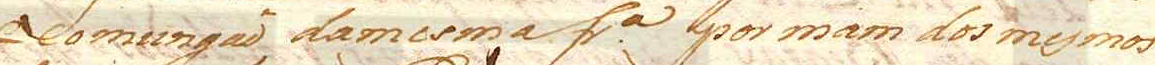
e comungaõ, da mesma fr.a por mam dos mesmos
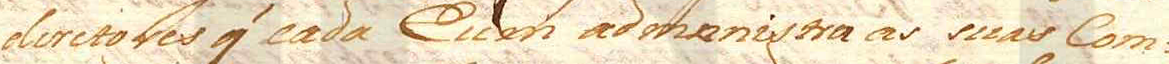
diretores q̄ cada hum admonistra as suas Com
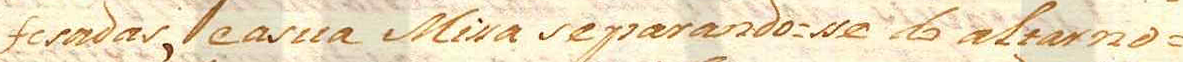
fesadas, e a sua Missa separando=sse do aLtar no
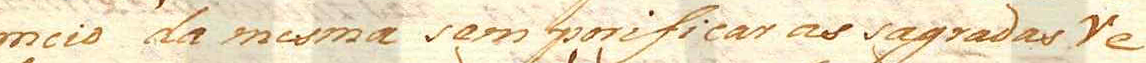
meio da mesma sem porificar as sagradas re
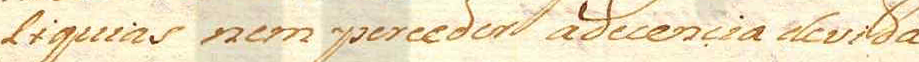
Liquias nem perceder adecencia devida
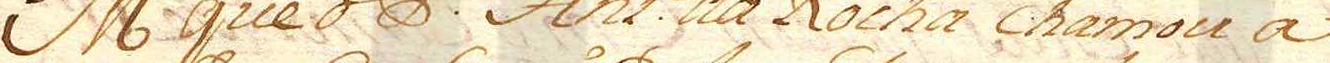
M que o P.e Anto da Rocha chamou a
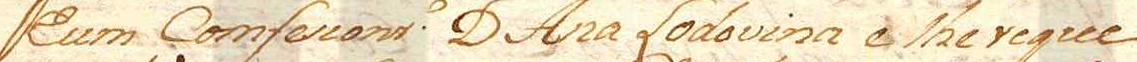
hum Comfesionr.o D. Ana Lodovina e lhe reque
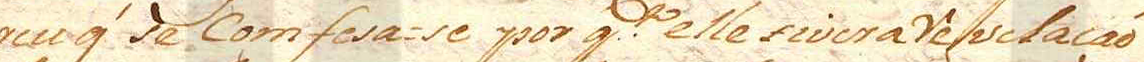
reu q̄ se Comfesa-se por q.r elle tivera reveLaçaõ
